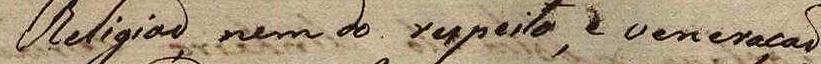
Religiaõ nem do respeito, e veneraçaõ,
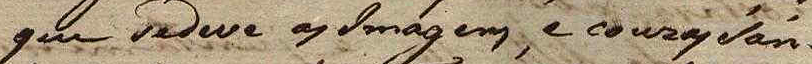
que se deve as Imagens, e couzas San
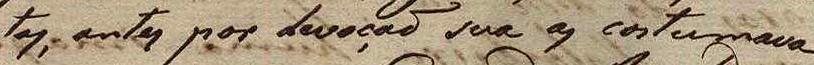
tas, antes por devoçaõ sua as costumava
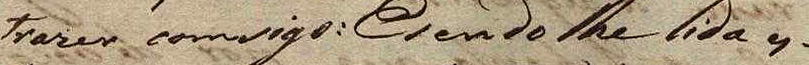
trazer comsigo: E sendo lhe lida es
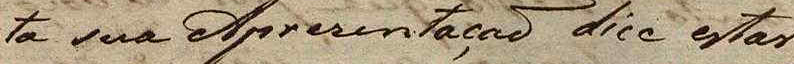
ta sua Apresentaçaõ dice estar
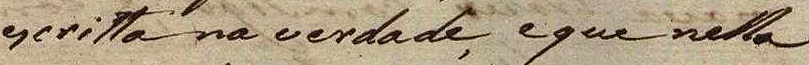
escritta na verdade, e que nella
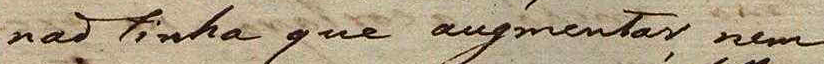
naõ tinha que augmentar, nem
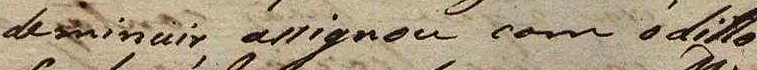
deminuir, assignou com o ditto
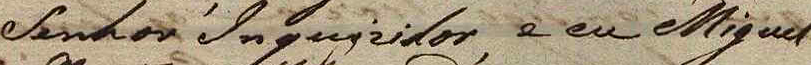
Senhor Inquizidor, e eu Miguel
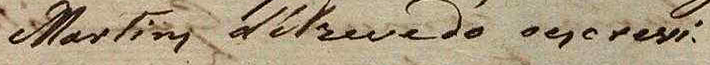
Martins d'Azevedo o escrevi.
